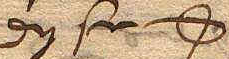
dyse
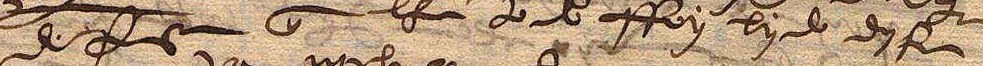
defesa q̄ lhe todo ffoy lydo dyse
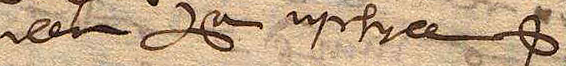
ella tsa njchyll
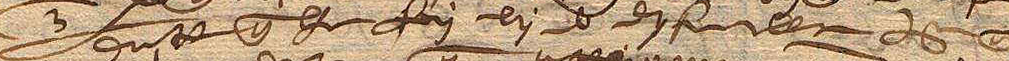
da Re q̄ lhe foy lydo dyse ella tsa q̄
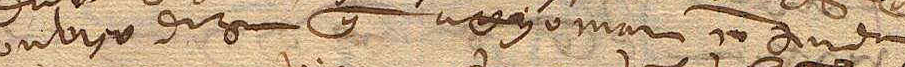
ouvyo dizer q̄ a gyomar cōteuda
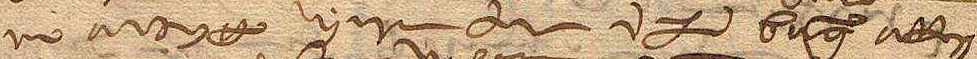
no artygo vyera ter ē hū barq̄o a Ry
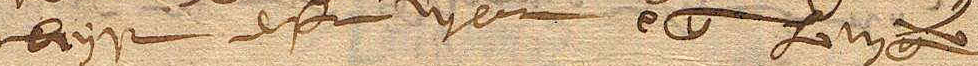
beyra desta vylla e q̄ ho vygro
